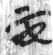𠁩
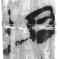坦
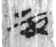𠁩
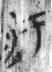汙
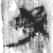𡚦（洝）
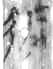凥（居）
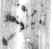之
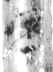不
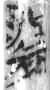○（盈）
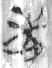志
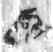西
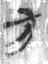方
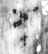又（有）
